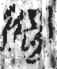弼
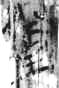堂
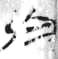於
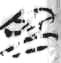室
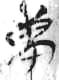東
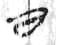日
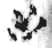出
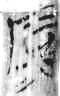庶（炙）
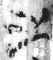之
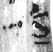必
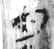肉
